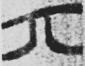亓（其）
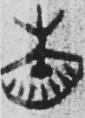本B（本）
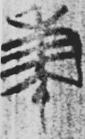秉
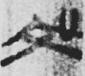吝（文）
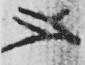之
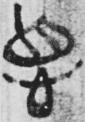惪（德）
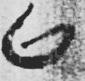㠯（以）
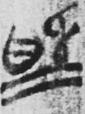爲
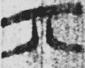亓（其）
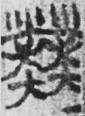○（業）
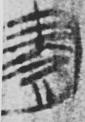肅
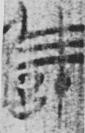○（雍）
